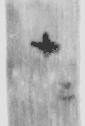十二
